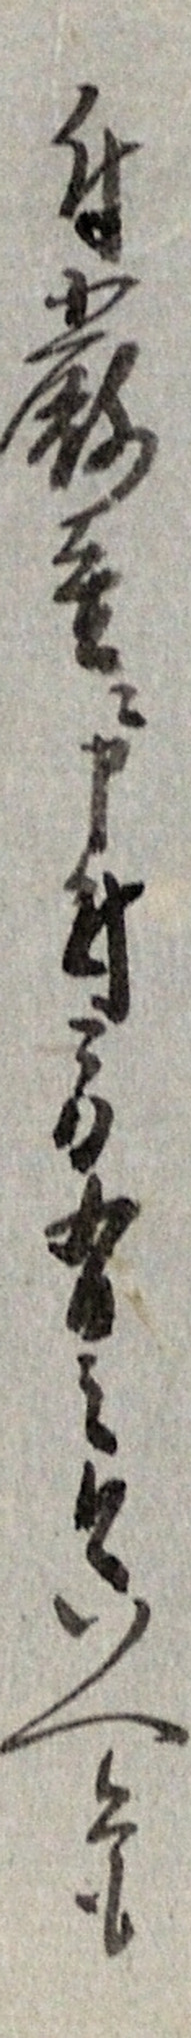付厳重ニ申付方有之といへとも
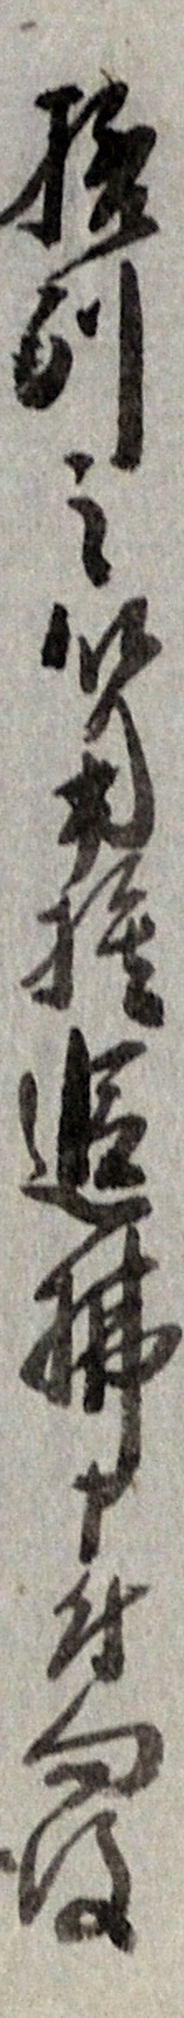格別之御用捨追払申付向後
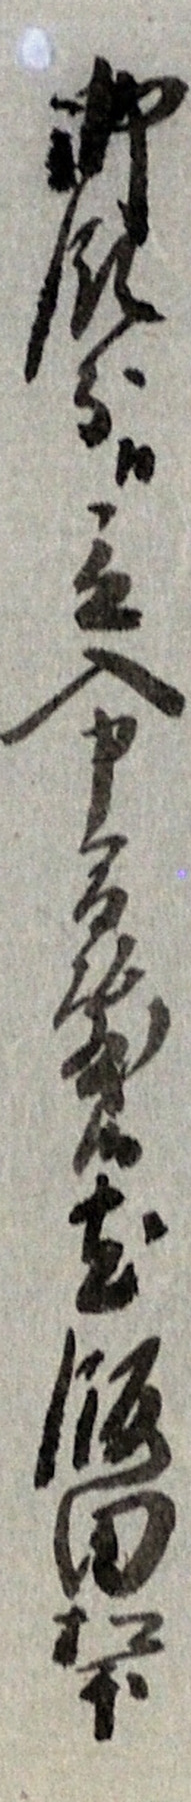御領分江立申間敷候尤飯田松本
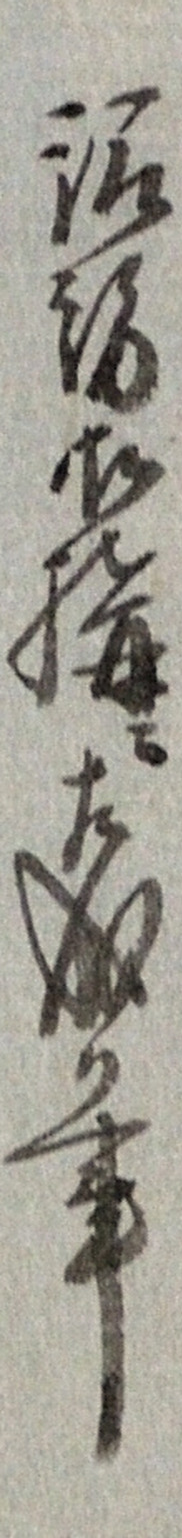諏訪御構ニ相成候事
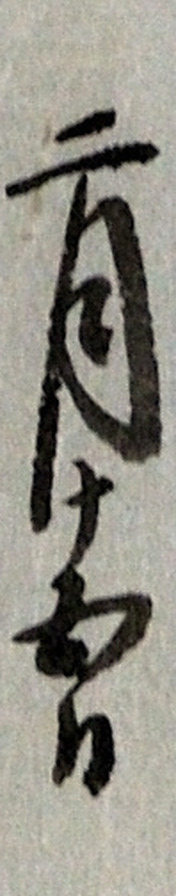二月十五日
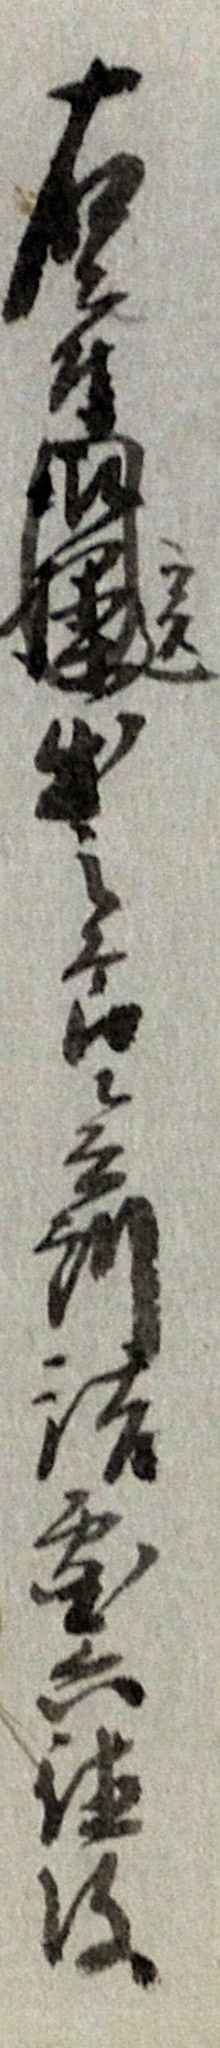右ニ付御繰出之節会所詰団六徳弥
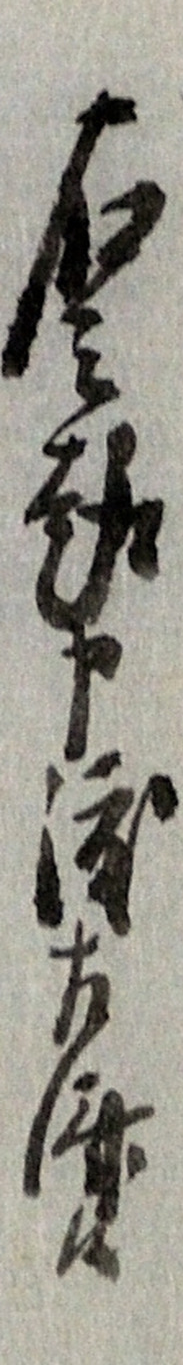右之趣申渡相済候
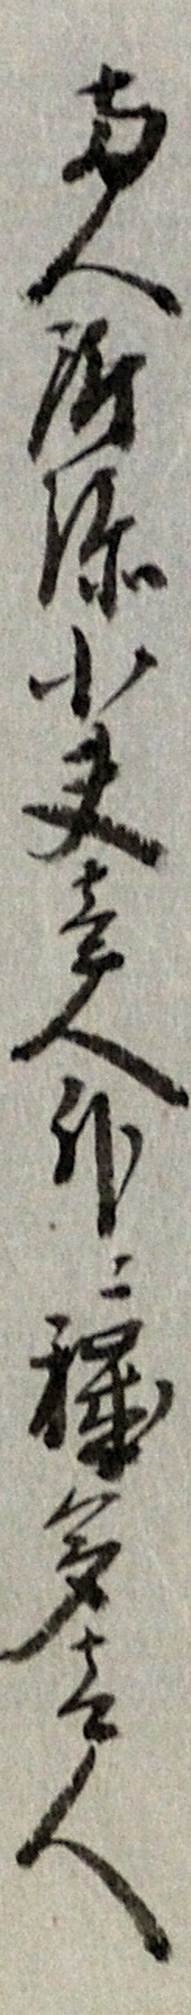両人附添小夫壱人外ニ穢多壱人
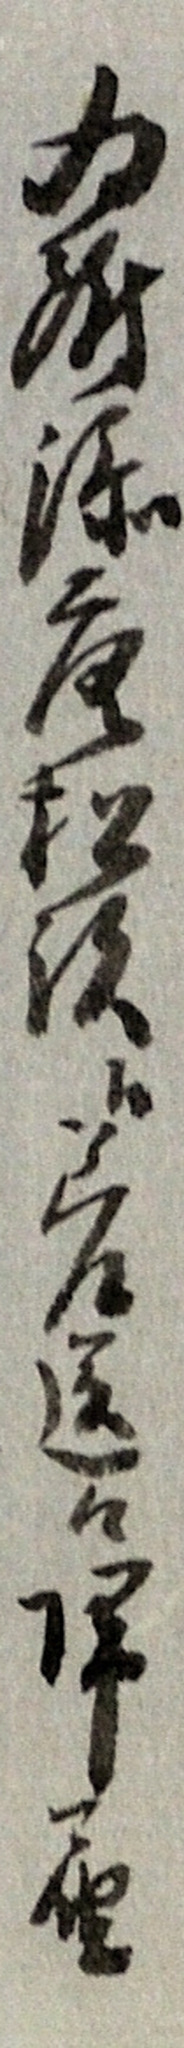為附添唐松沢江差送候帰届
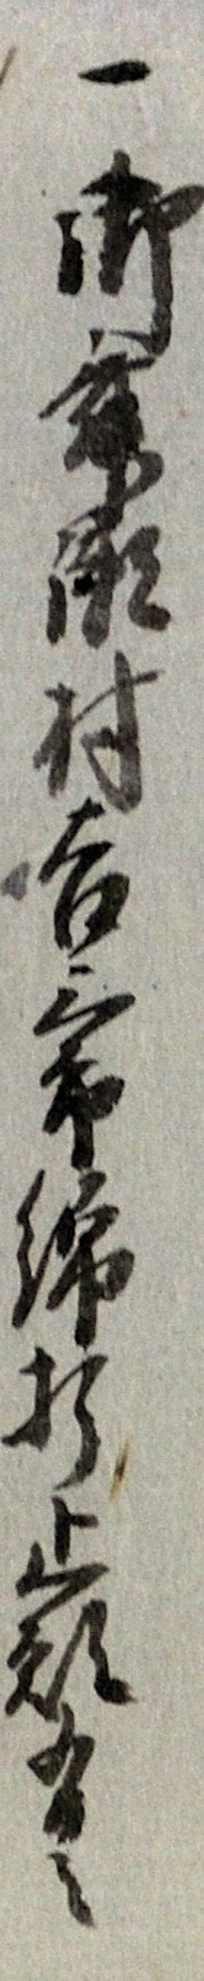一御舞瀬村吉三郎綿打止願有之
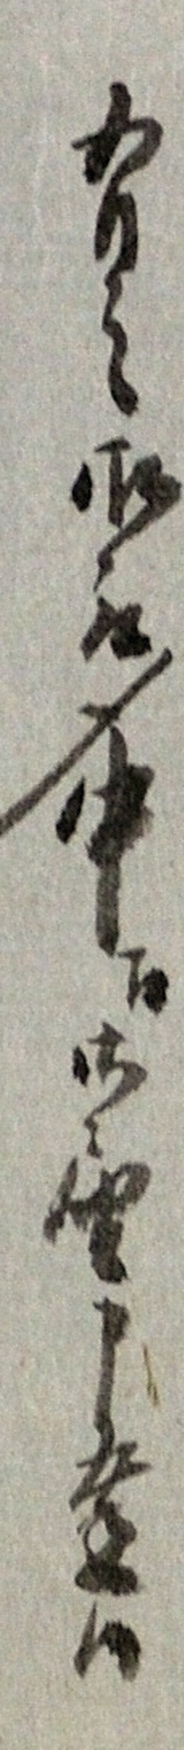有之御取〆中江御届申置候
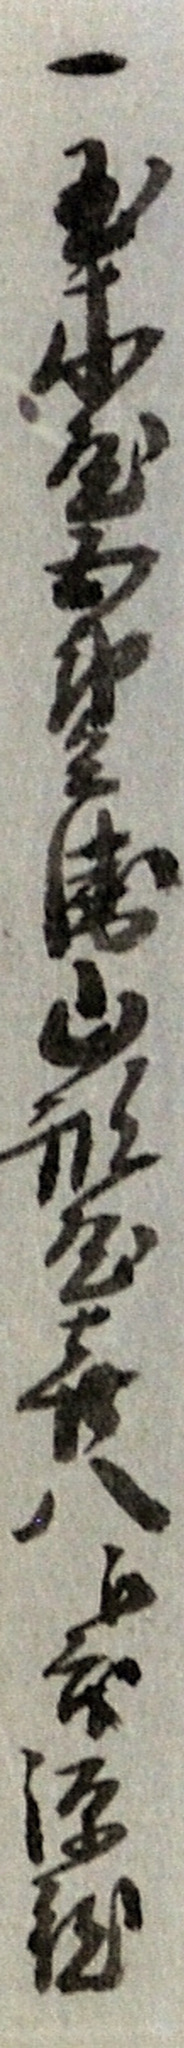一白木屋五郎兵衛山形屋喜八江茂源蔵
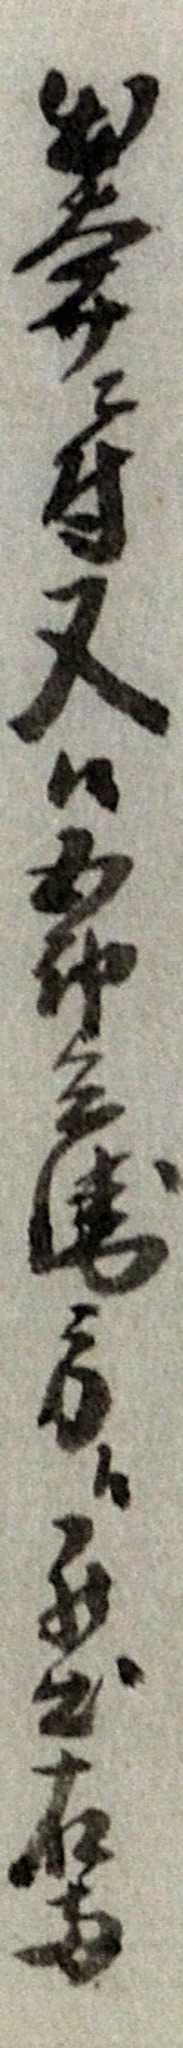出奔ニ付又ハ五郎兵衛方江罷出右両
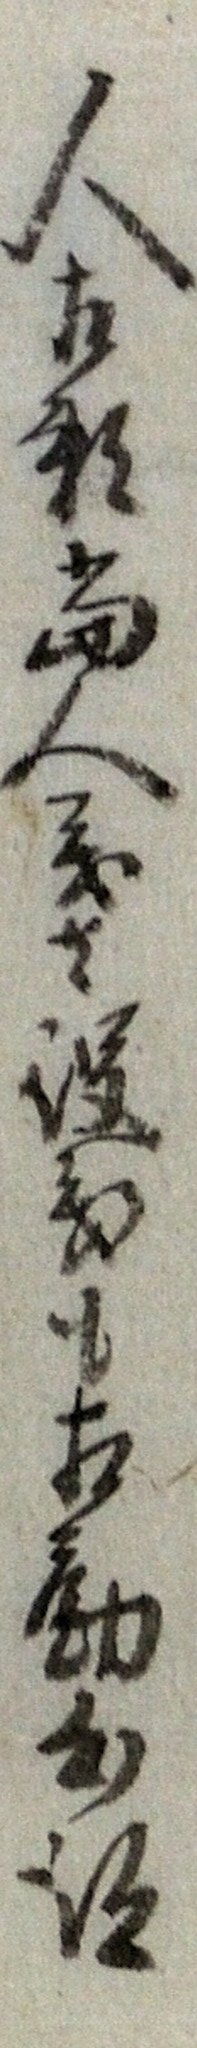人相頼当人義者役義も相勤心得
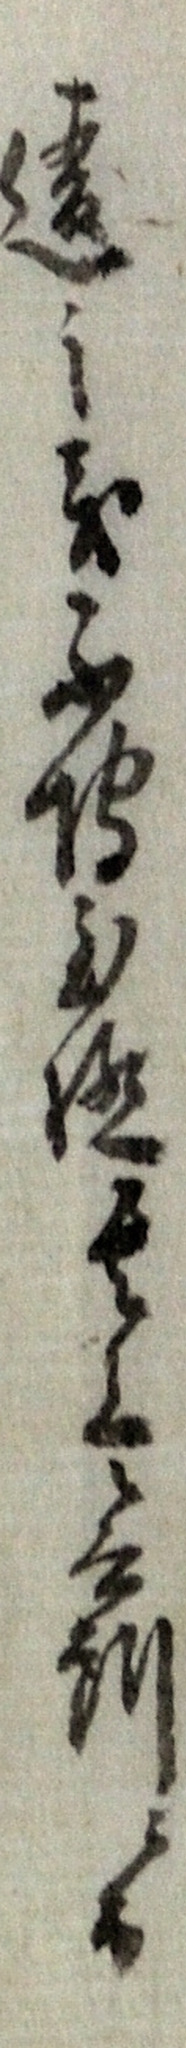違之義不埒至極其上会所ニ而

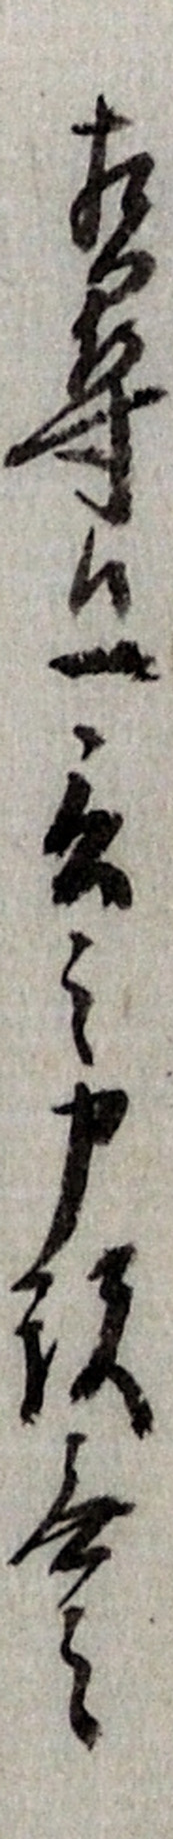相尋候一言之申訳無之
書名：諸事御用留
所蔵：伊那市立高遠町図書館・合同会社AMANE
